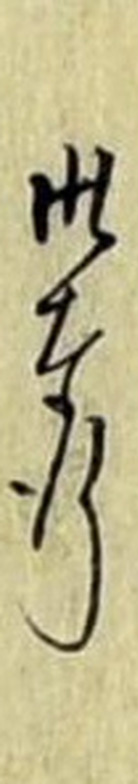御奉行
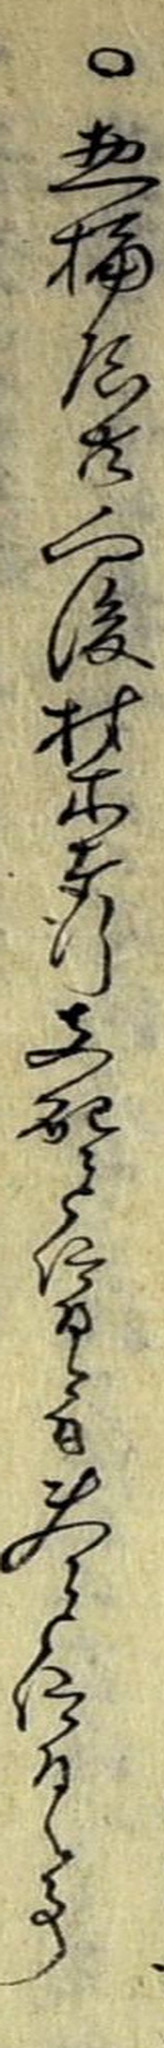〇惣桶屋共向後材木奉行支配ニ被仰付候ニ付夫々被仰付候事
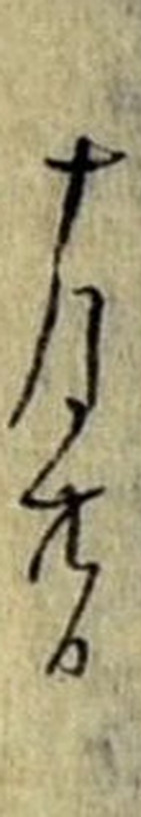十月廿日

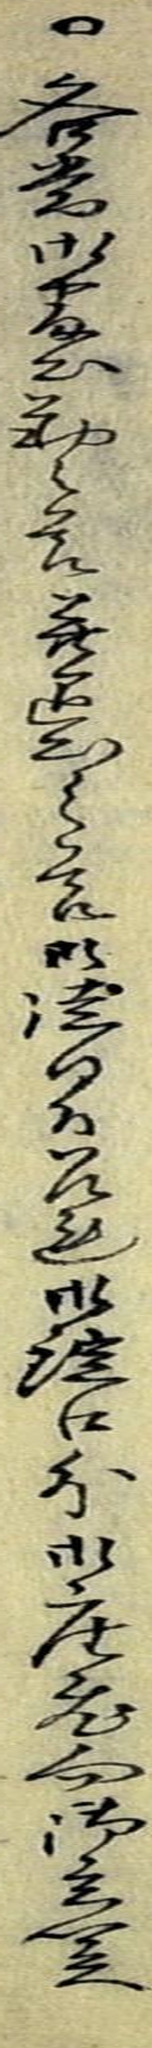〇各当御番出勤之節并退出之節御徒目付召連御錠口外御座敷向御玄関
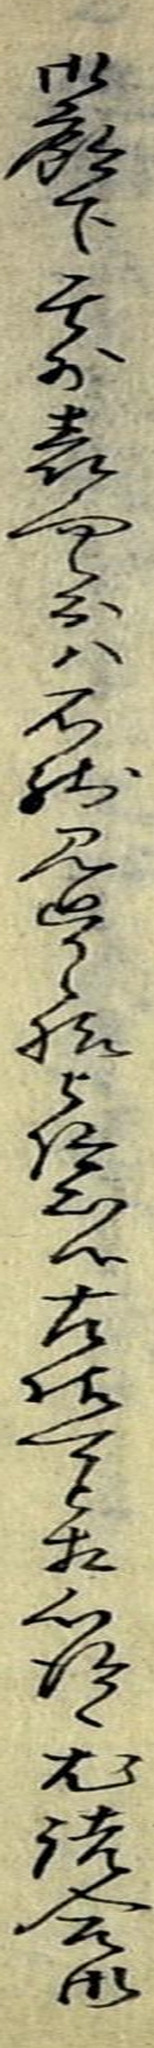御廊下其外表向之分ハ不残見廻り候様被仰出候左様可被相心得候尤詰合御
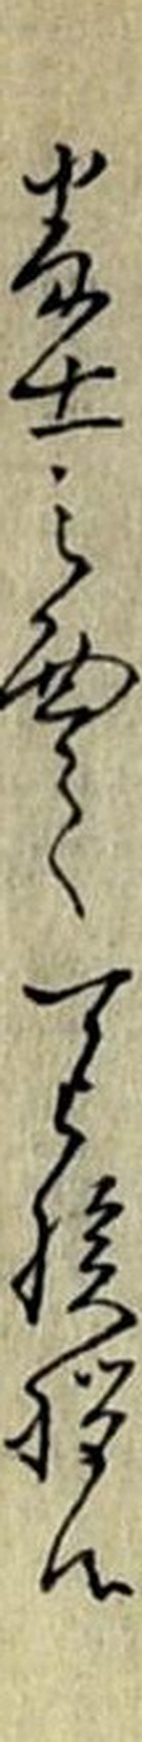番士之面々へ可被挨拶候
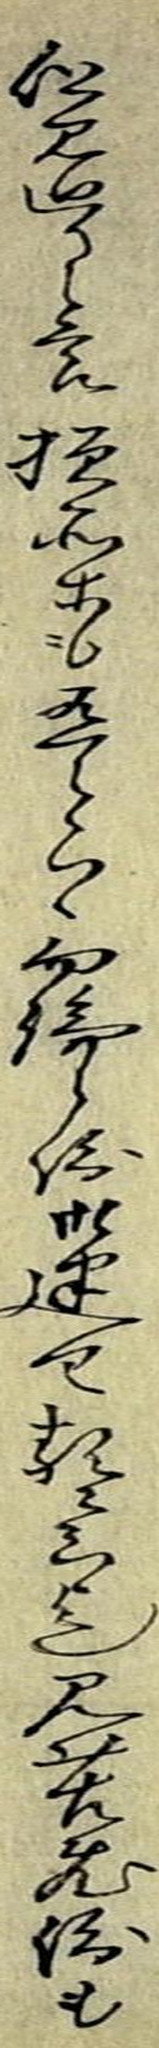但見廻り之節損所等も有之候ハヽ勿論之儀御建具類ニ至迄見苦敷儀も
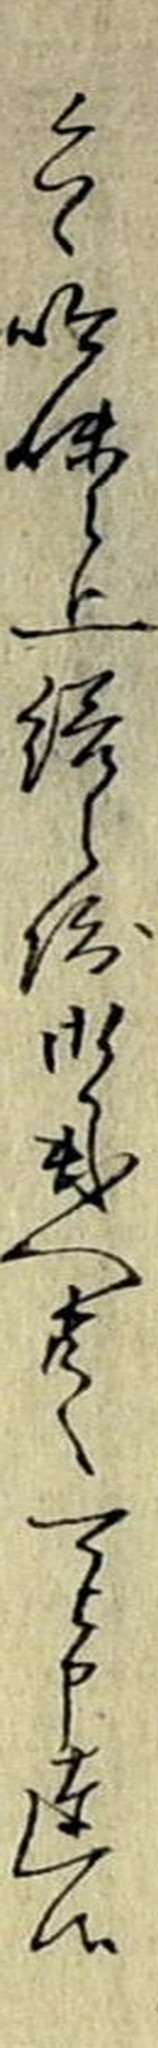候ハヽ吟味之上繕之儀御用人共へ可被申達候
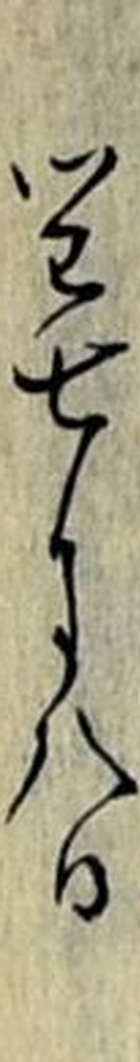閏七月八日

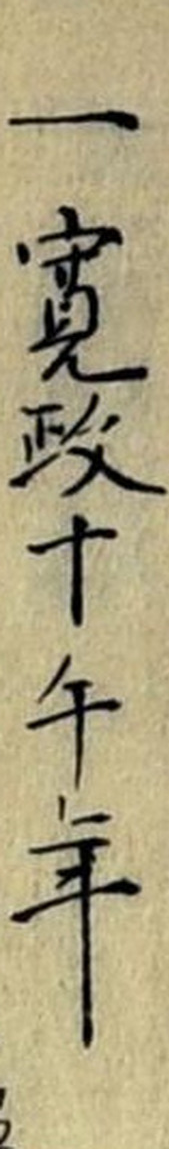一寛政十午年
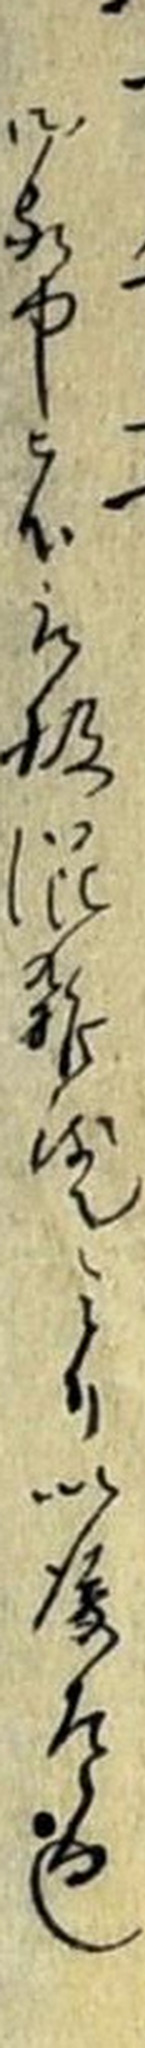御家中被下取扱混雑致シ候ニ付以後左之通
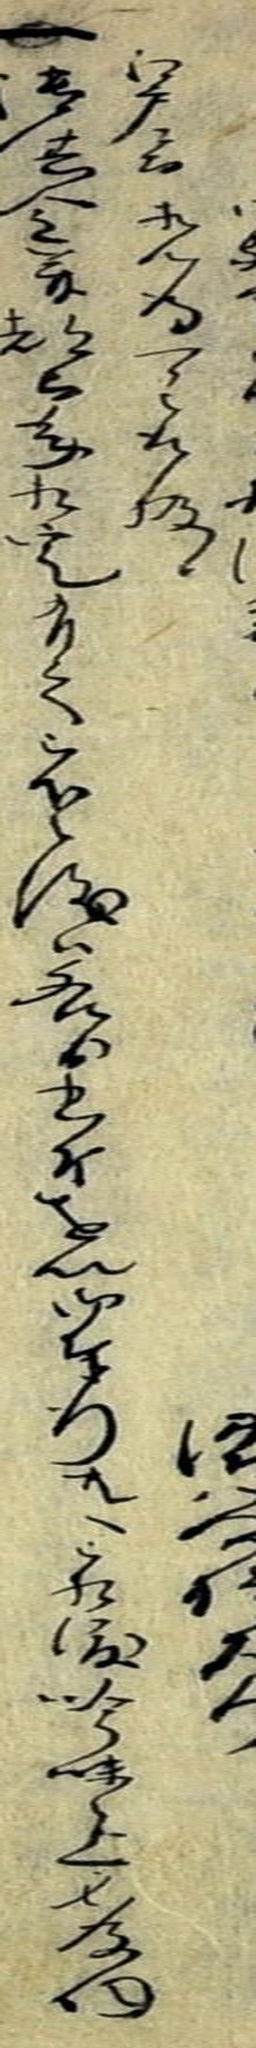一御金并都而年相定有之被下候儀ハ各ゟ書付を以御奉行共へ被相渡吟味之上不及伺
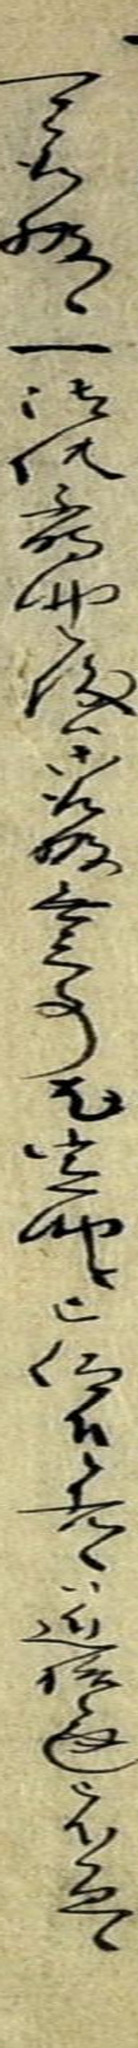可被取扱候一御供不時助之儀ハ御取扱無之事尤定助ニ被仰付候者へハ近格之通被下置候
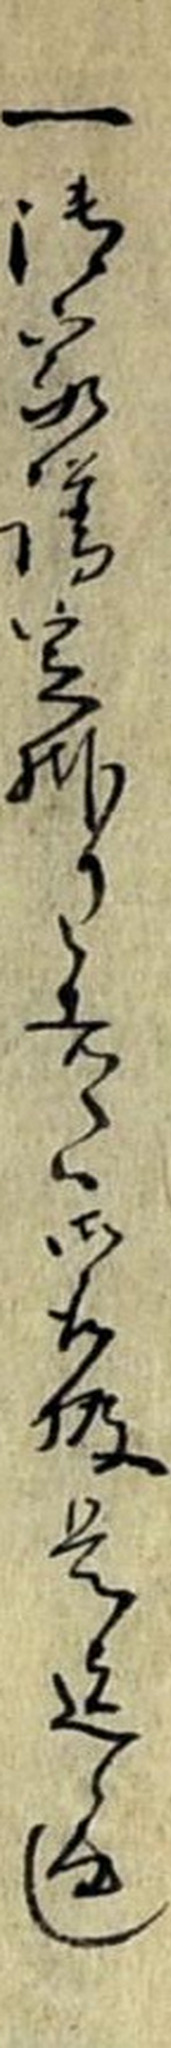一御家譜定掛り之者へハ御取扱是迄之通
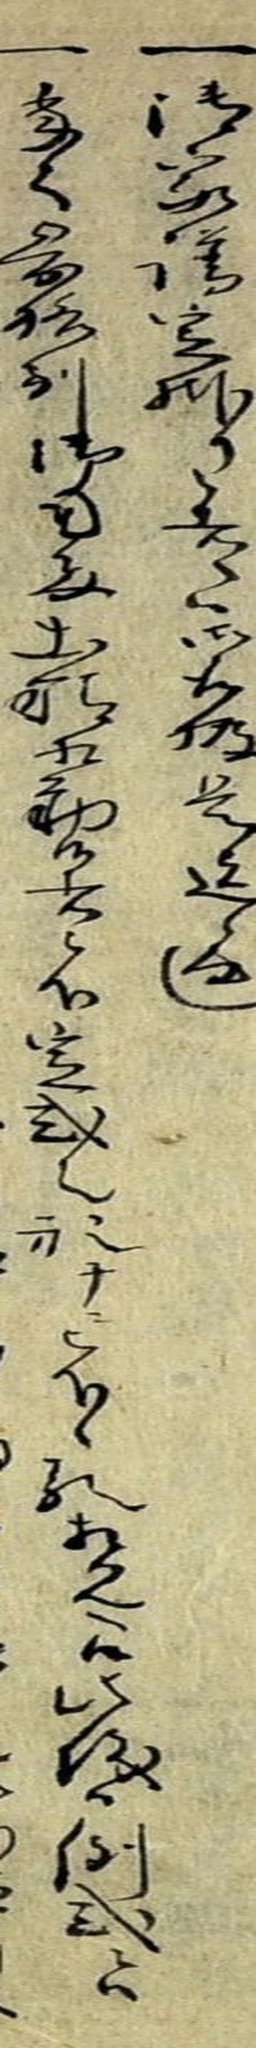一年々寄格列御用番出精相勤候者被下定式之形チニ被下候類相見へ候此儀ハ例式ニハ
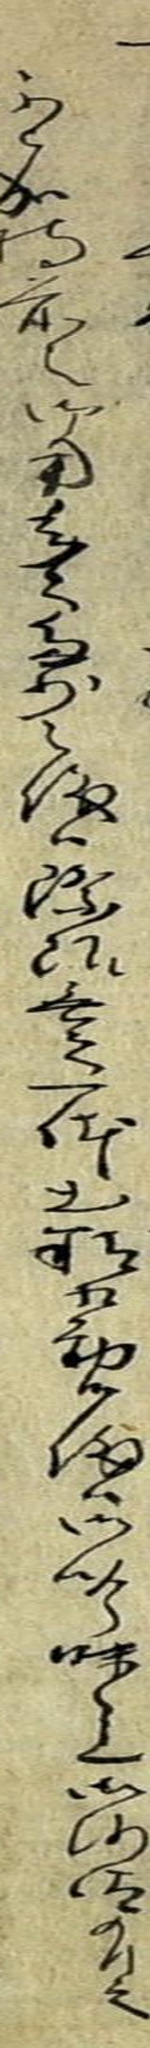不被成持前之御用年々多少之儀ハ際限無之一体出精相勤候儀ハ御吟味之上御沙汰有之
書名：命令之部 三
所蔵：福井県文書館 Fukui Prefectural Archives
